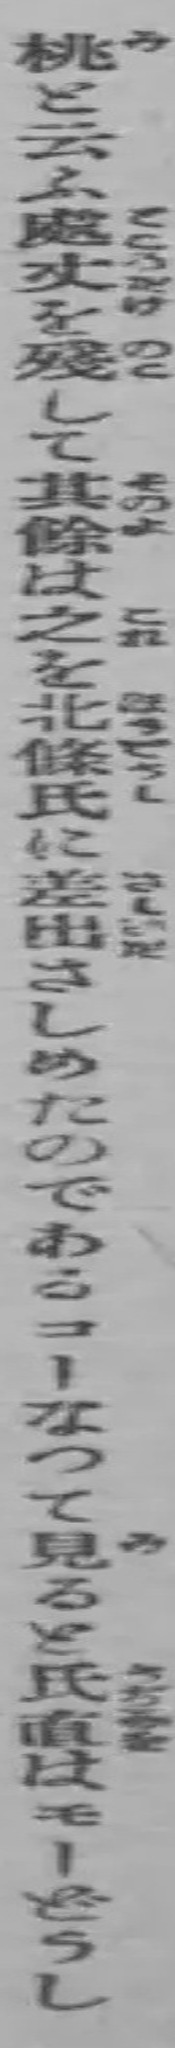桃と云ふ処丈を残して其余は之を北條氏に差出さしめたのであるコーなつて見ると氏直はモーどうし
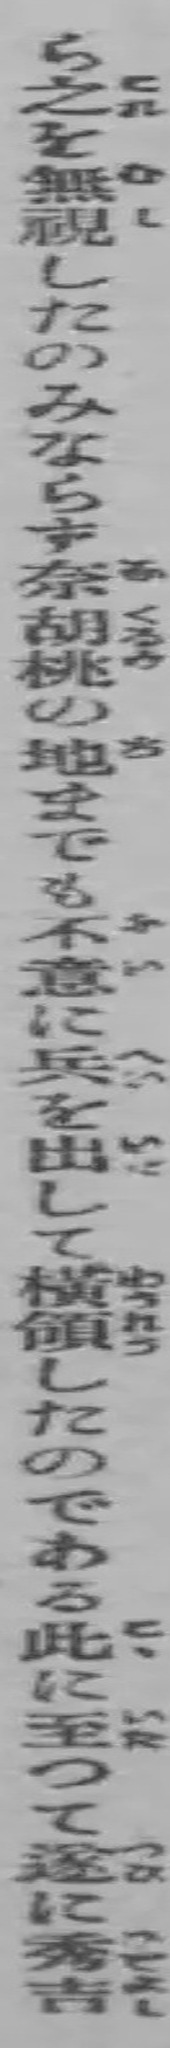ら之を無視したのみならず奈胡桃の地までも不意に兵を出して横領したのである此に至つて遂に秀吉
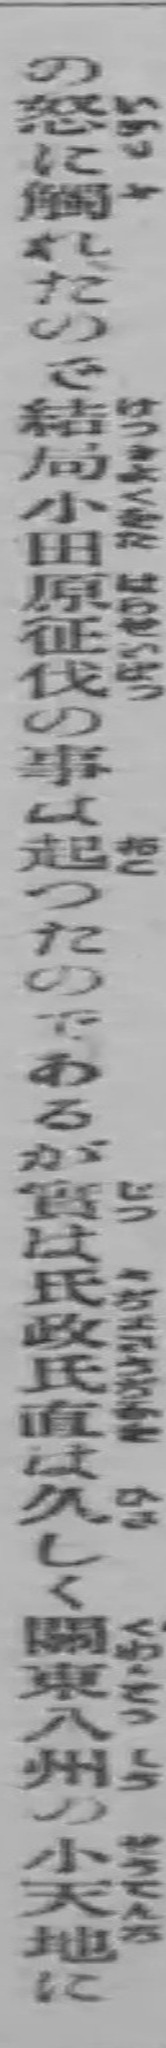の怒に触れたので結局小田原征伐の事は起つたのであるが実は氏政氏直は久しく関東八州の小天地に
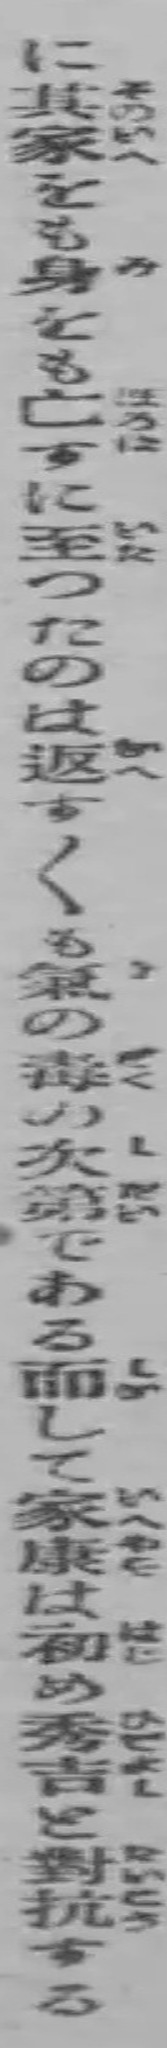通ぜずに其家をも身をも亡すに至つたのは返す〳〵も気の毒の次第である而して家康は初め秀吉と対抗する
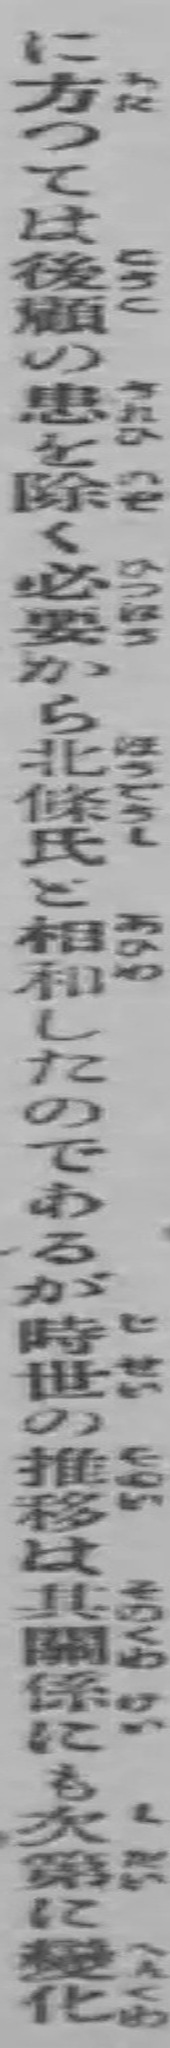に方つては後顧の患を除く必要から北條氏と相和したのであるが時世の推移は其関係にも次第に変化
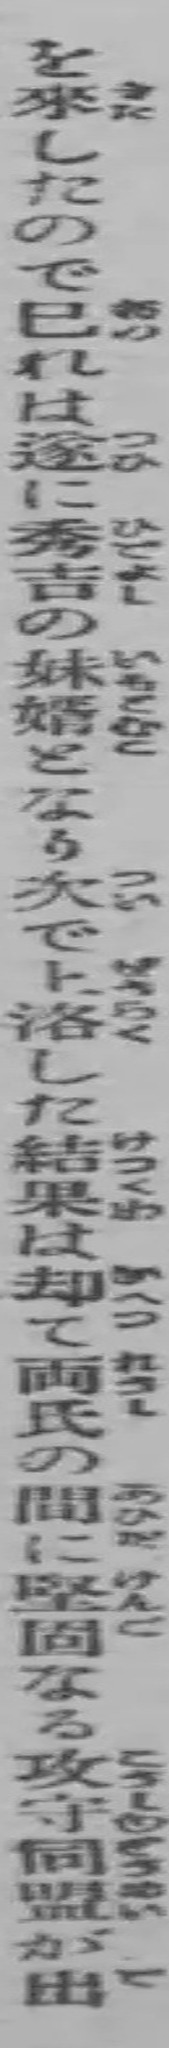を来したので巳れは遂に秀吉の妹婿となり次で上洛した結果は却て両氏の間に堅固なる攻守同盟が出
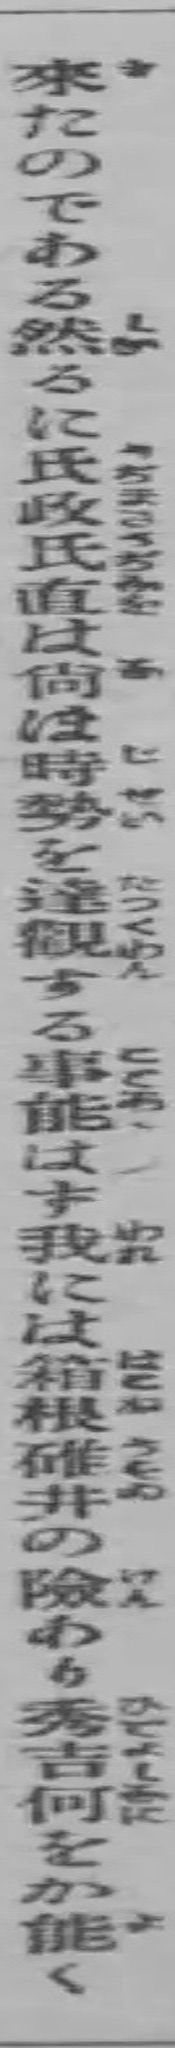来たのである然るに氏政氏直は尚ほ時勢を達観する事能はず我には箱根碓井の険あり秀吉何をか能く
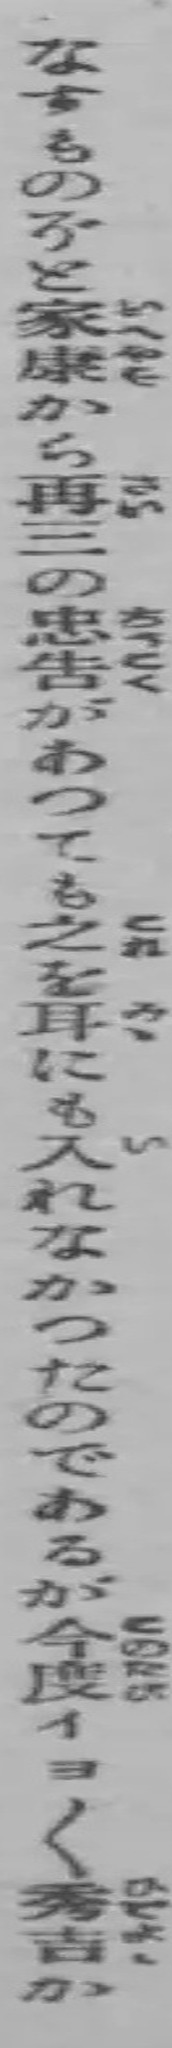なすものぞと家康から再三の忠告があつても之を耳にも入れなかつたのであるが今度イヨ〳〵秀吉か
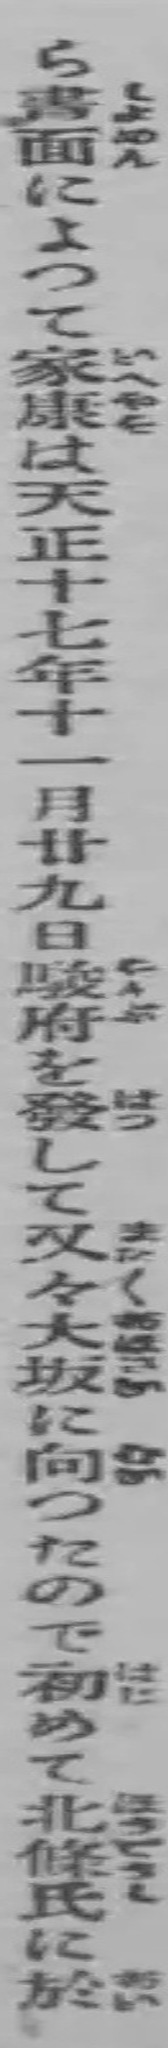ら書面によつて家康は天正十七年十一月廿九日駿府を発して又々大坂に向つたので初めて北條氏に於
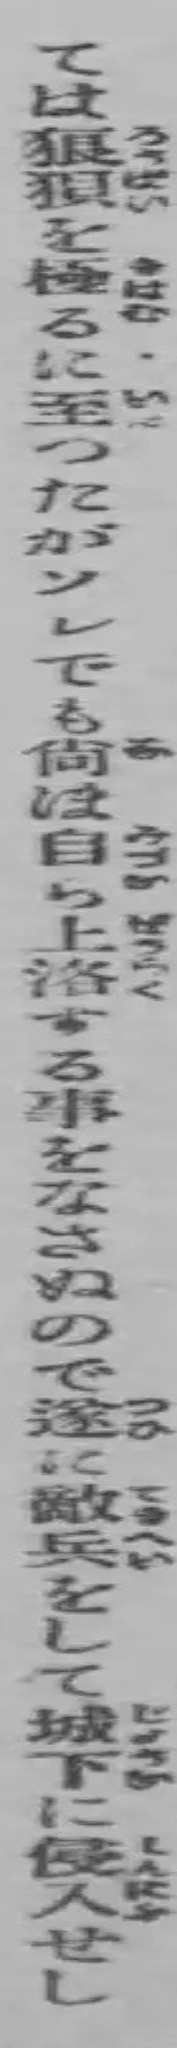ては狼狽を極るに至つたがソレでも尚ほ自ら上洛する事をなさぬので遂に敵兵をして城下に侵入せし
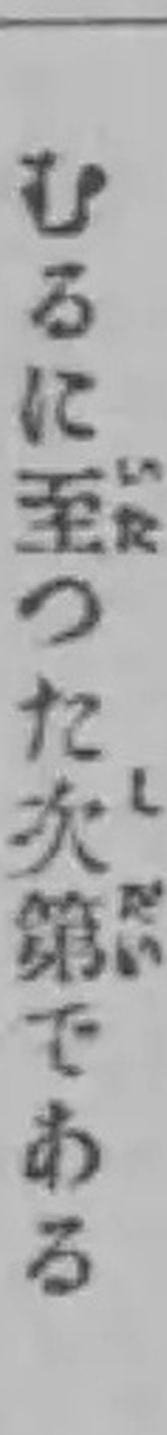むるに至つた次第である
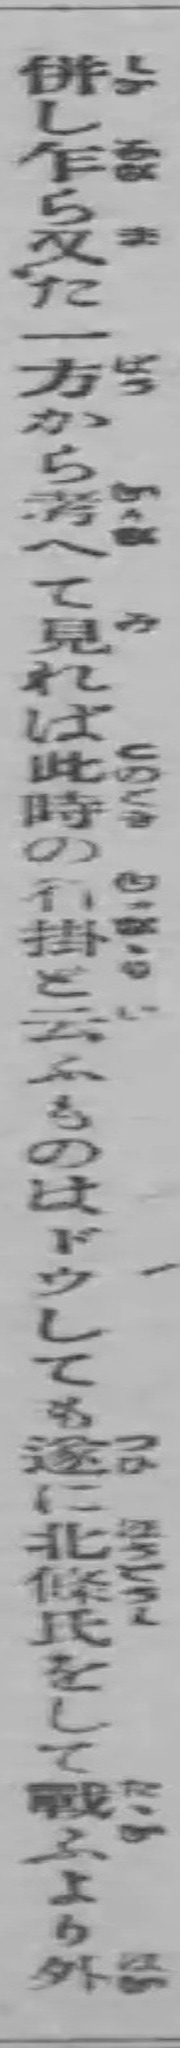併し乍ら又た一方から考へて見れば此時の行掛と云ふものはドウしても遂に北條氏をして戦ふより外
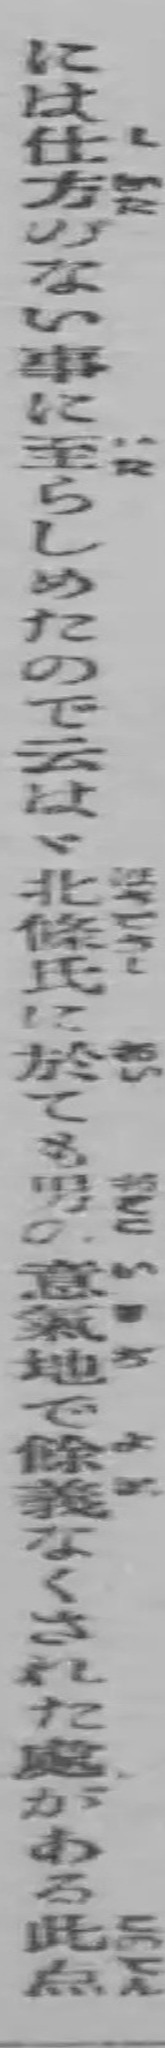には仕方のない事に至らしめたので云はゞ北條氏に於ても男の意気地で余義なくされた処がある此点
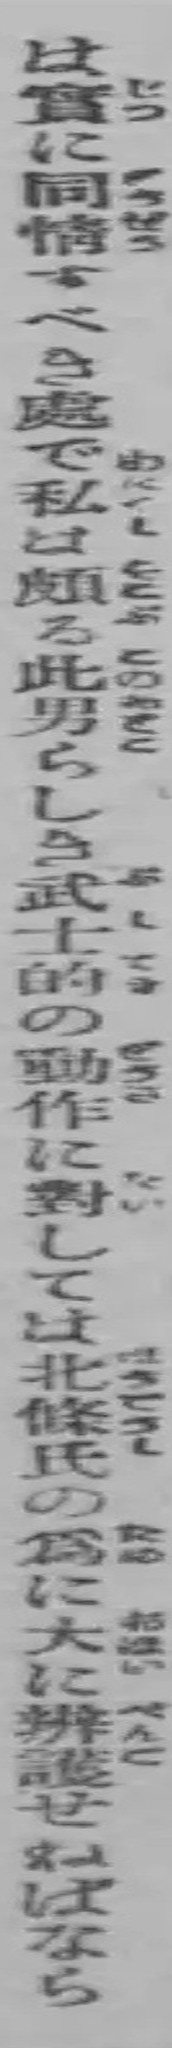は実に同情すべき処で私は頗る此男らしき武士的の動作に対しては北條氏の為に大に弁護せねばなら
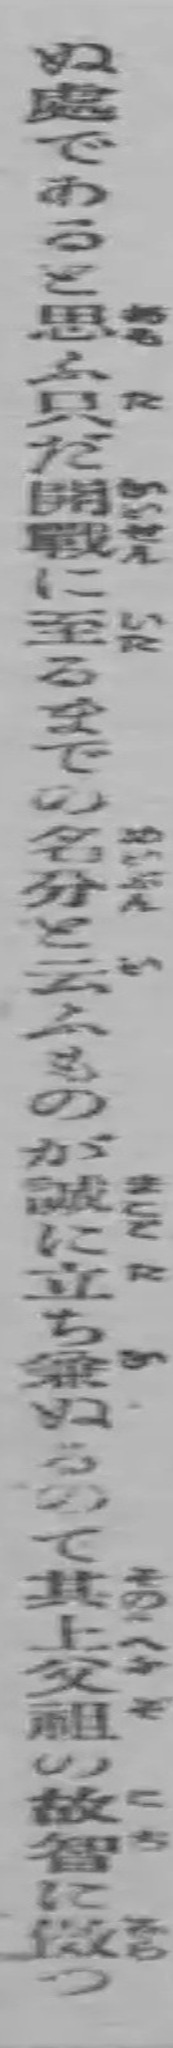ぬ処であると思ふ只だ開戦に至るまでの名分と云ふものが誠に立ち兼ぬるので其上父祖の故智に倣つ
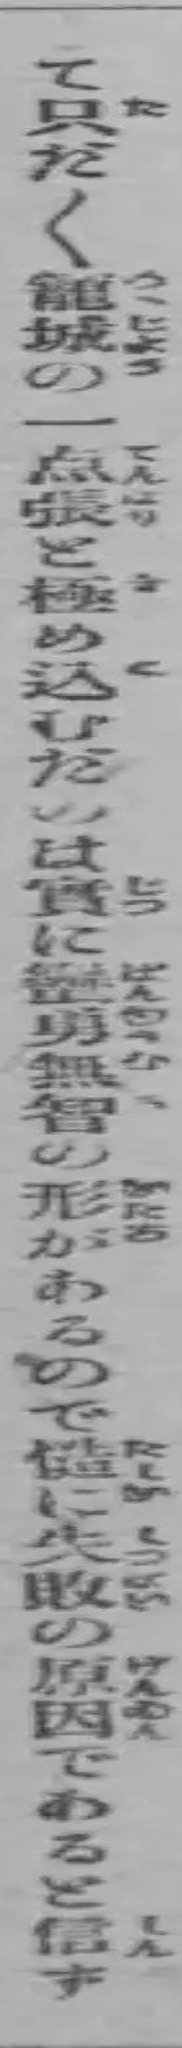て只だ〳〵籠城の一点張と極め込むだのは実に蛮勇無智の形があるので慥に失敗の原因であると信ず
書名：豊橋市史談
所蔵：国立国会図書館 National Diet Library, JAPAN
